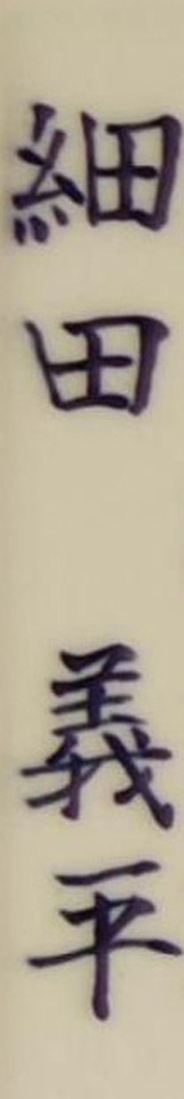細田義平

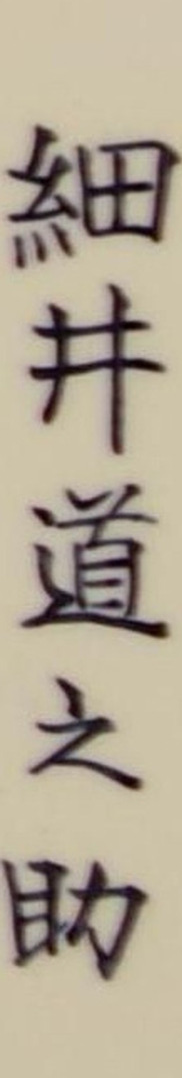細井道之助
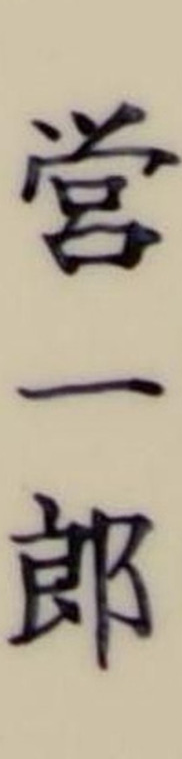営一郎
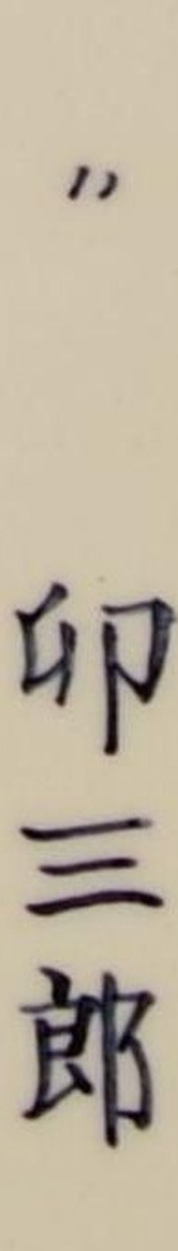卯三郎
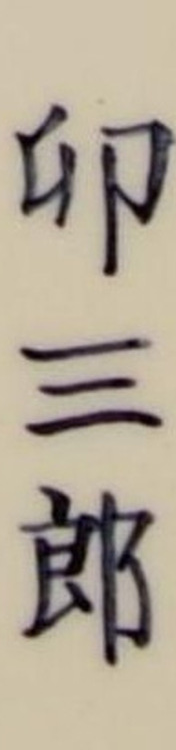卯三郎
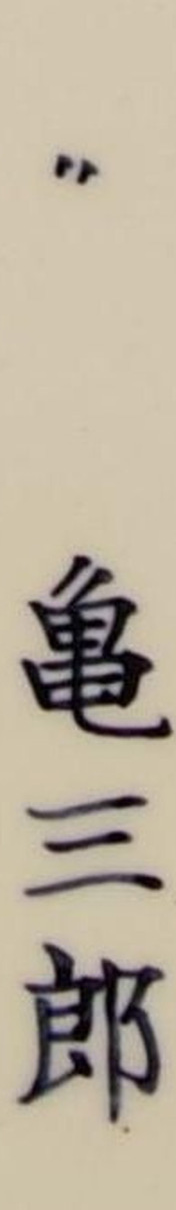亀三郎
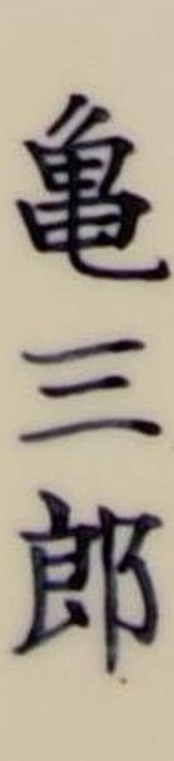亀三郎
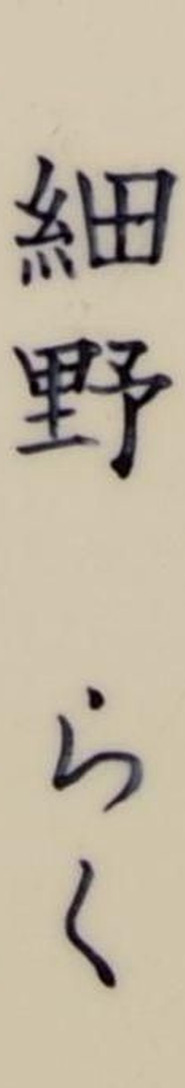細野らく
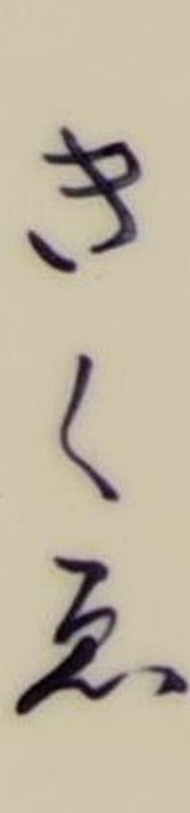きくゑ
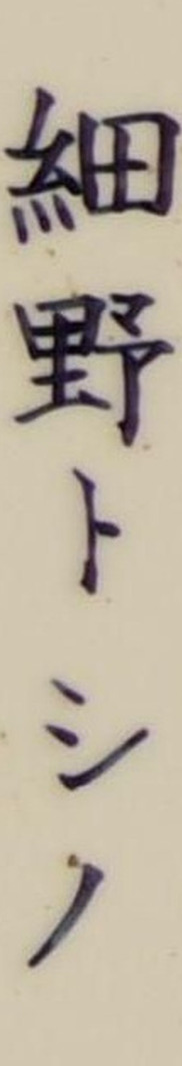細野トシノ

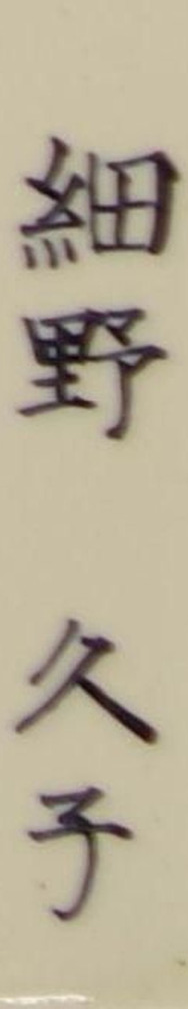細野久子
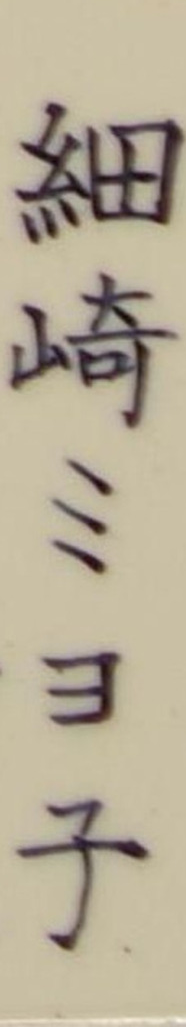細崎ミヨ子
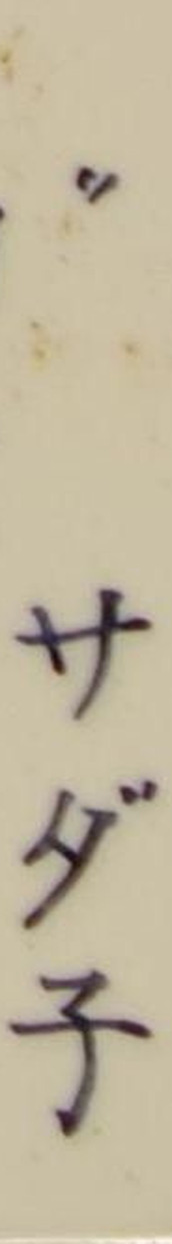サダ子
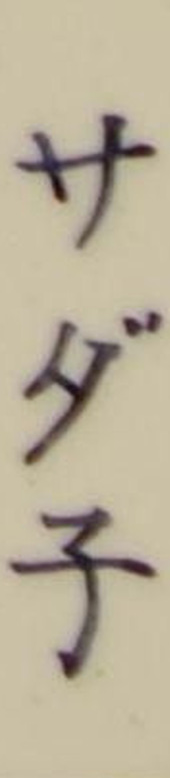サダ子
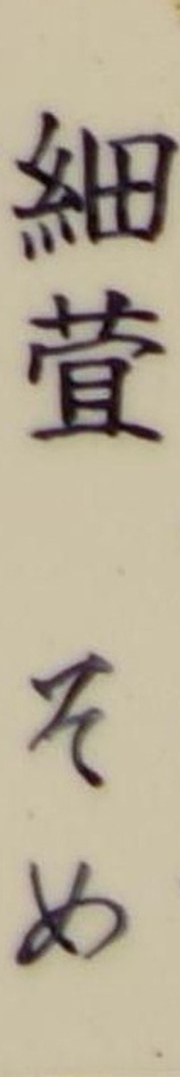細萱そめ
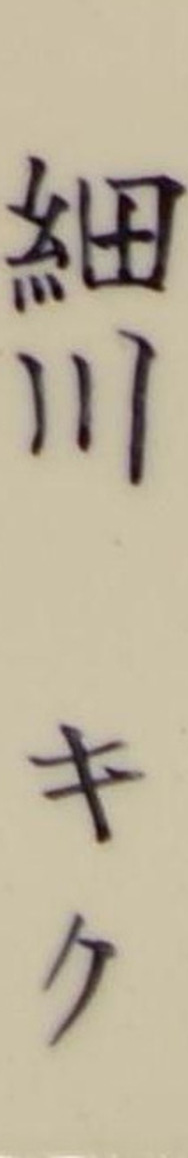細川キク
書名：A~D
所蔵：koyasan kongobuji
